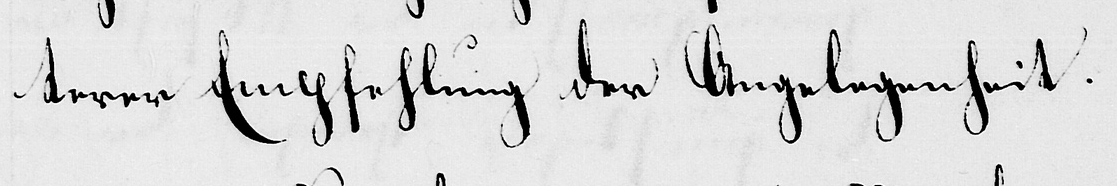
terer Empfehlung der Angelegenheit.
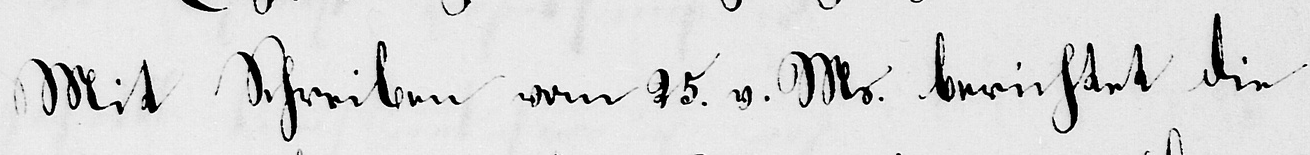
Mit Schreiben vom 25. v. Ms. berichtet die
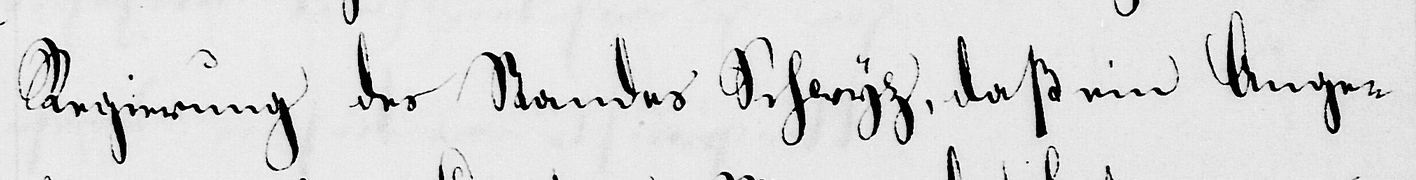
Regierung des Standes Schwyz, daß ein Ange¬
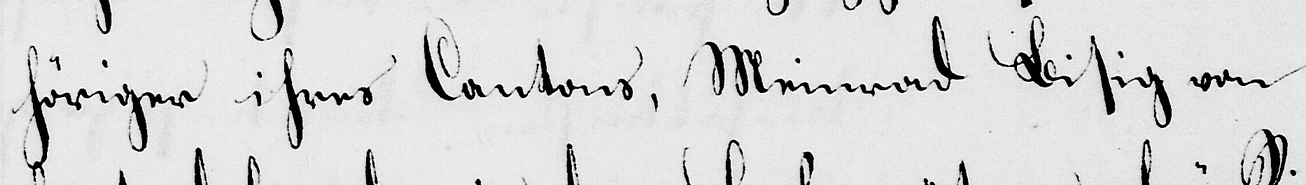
höriger ihres Cantons, Meinrad Bisig von
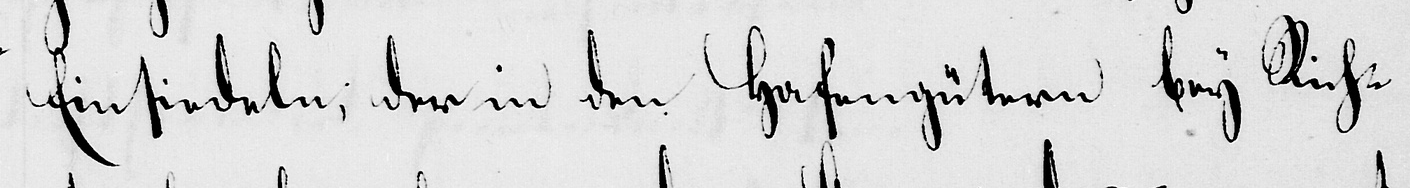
Einsiedeln, der in den Hafengütern bey Rich¬
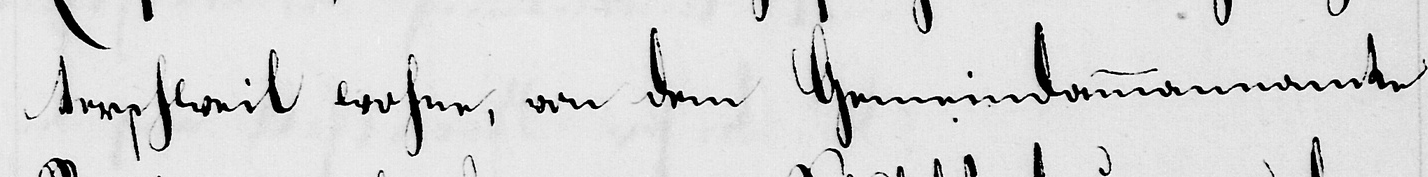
terschweil wohne, von dem Gemeindammannamte
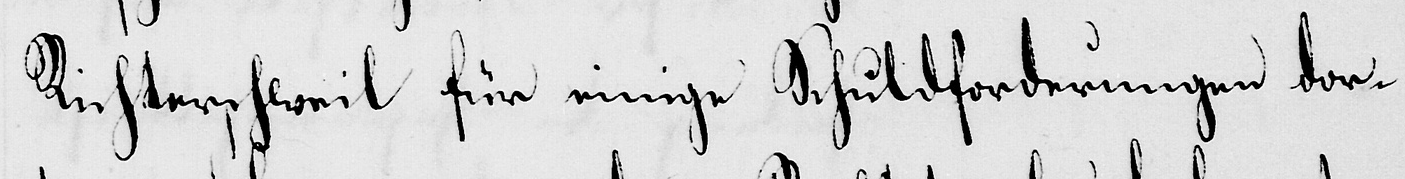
Richterschweil für einige Schuldforderungen dor¬
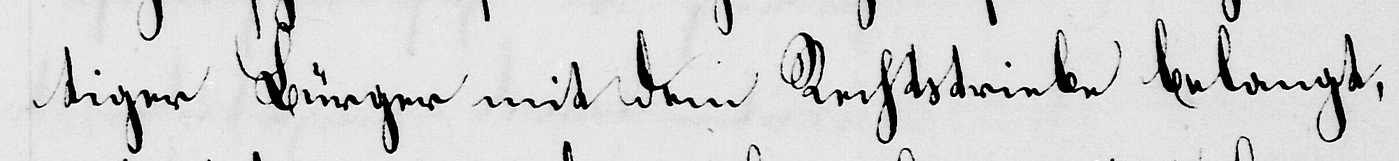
tiger Bürger mit dem Rechtstriebe belangt,
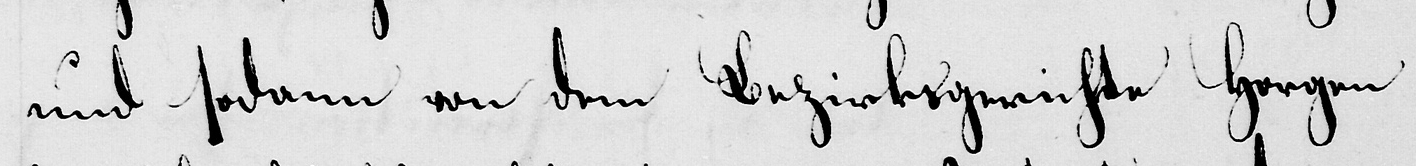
und sodann von dem Bezirksgerichte Horgen
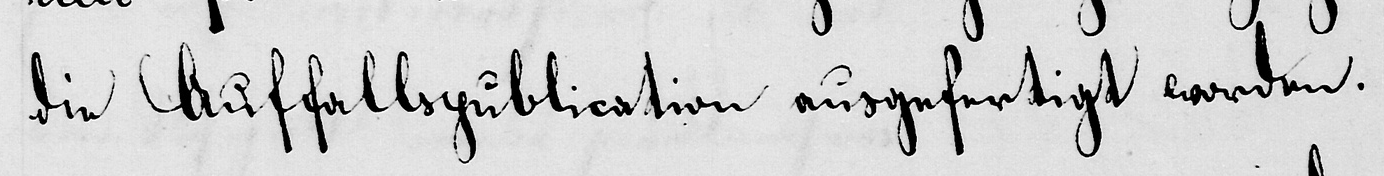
die Auffallspublication ausgefertigt worden.
